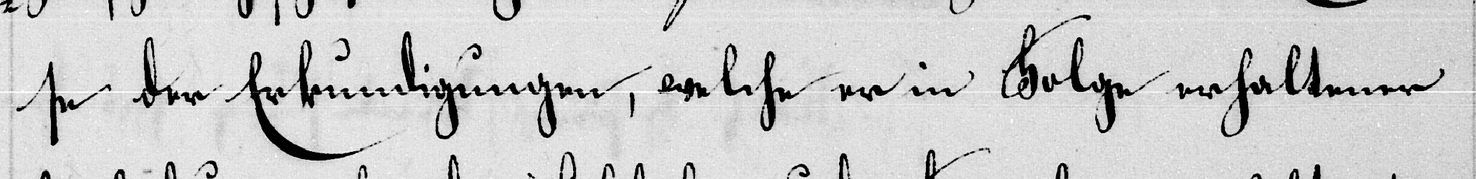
ße der Erkundigungen, welche er in Folge erhaltener
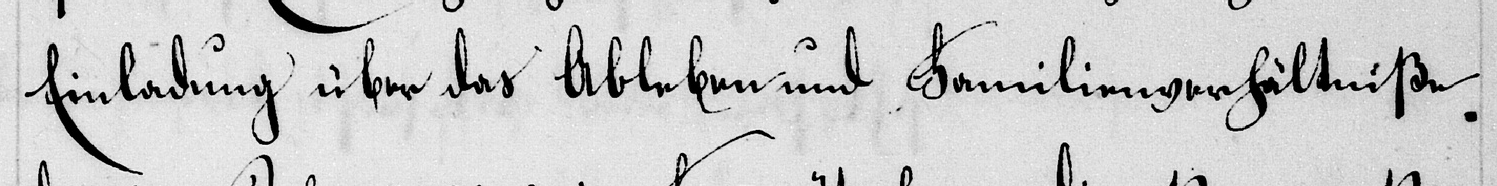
Einladung über das Ableben und Familienverhältniße
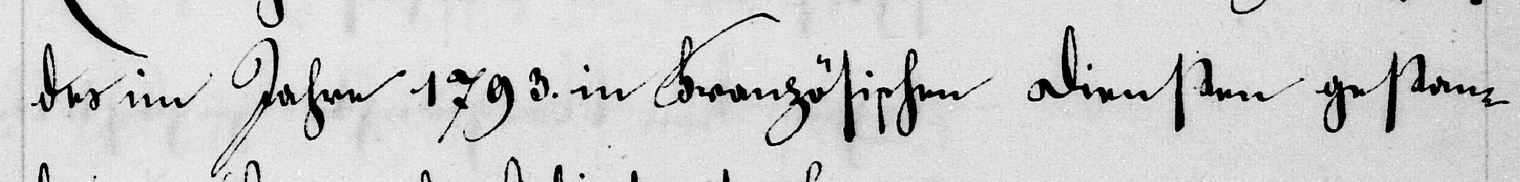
des im Jahre 1793. in Französischen Diensten gestan¬
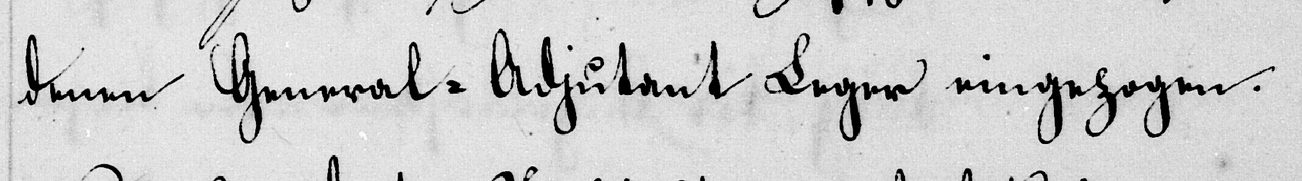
denen General-Adjutant Leger eingezogen.
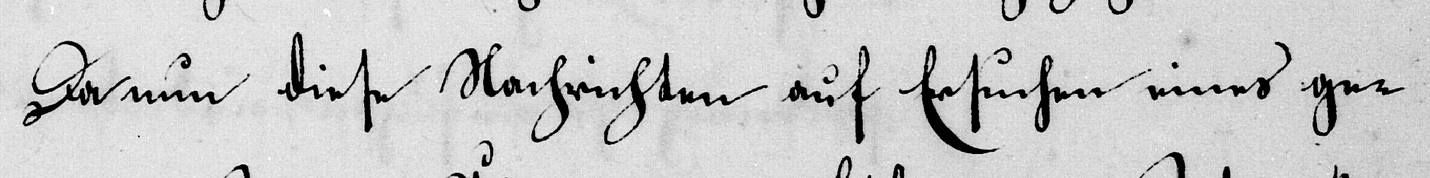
Da nun diese Nachrichten auf Ersuchen eines ge¬
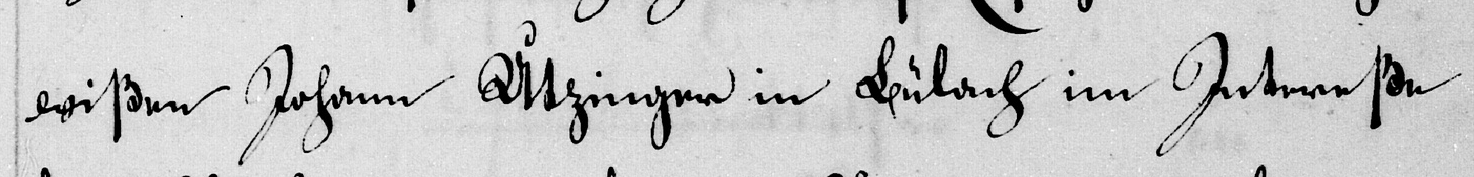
wißen Johann Utzinger in Bülach im Intereße
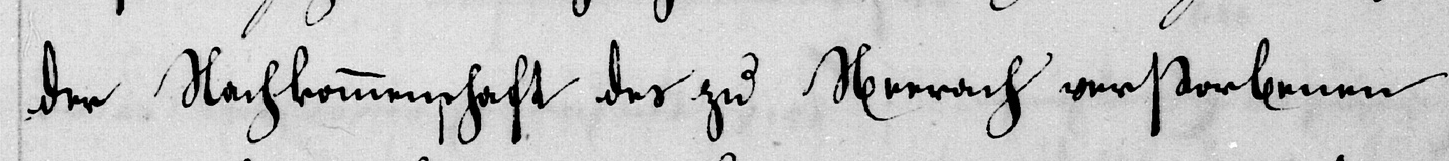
der Nachkommenschaft des zu Heerach verstorbenen
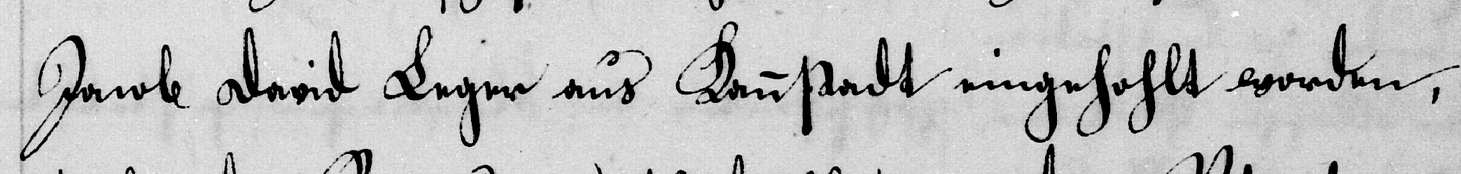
Jacob David Leger aus Bannstadt eingehohlt worden,
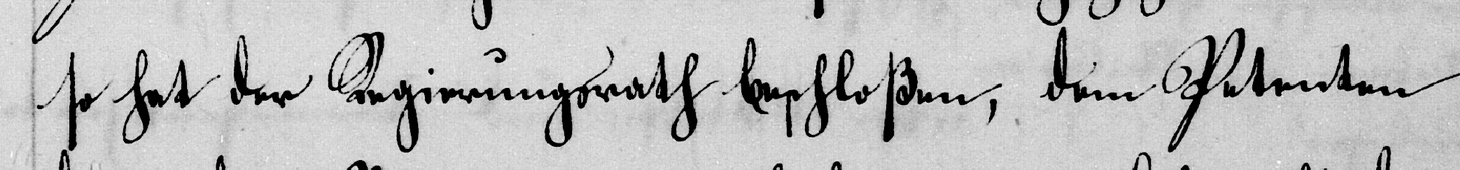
so hat der Regierungsrath beschloßen, dem Petenten
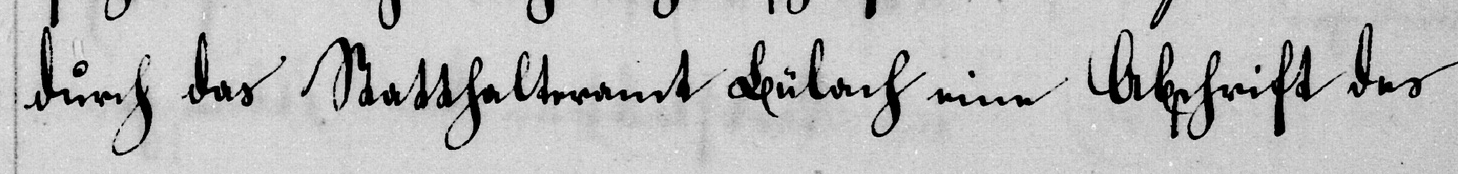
durch das Statthalteramt Bülach eine Abschrift des
